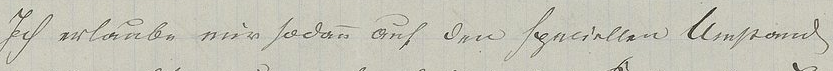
Ich erlaube mir sodann auf den speziellen Umstand
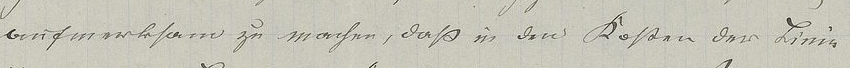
aufmerksam zu machen, daß in den Kosten der Linie
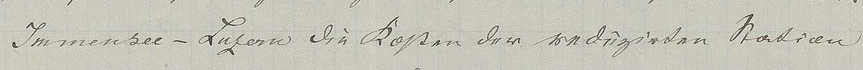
Immensee–Luzern die Kosten der reduzirten Station
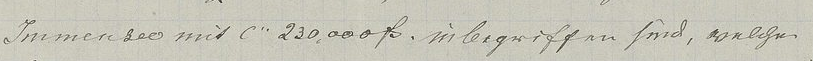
Immensee mit Ca 230,000 fs. inbegriffen sind, welche
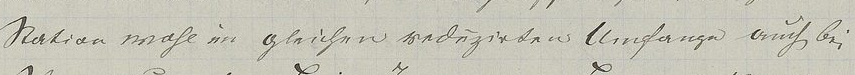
Station wohl im gleichen reduzirten Umfange auch bei
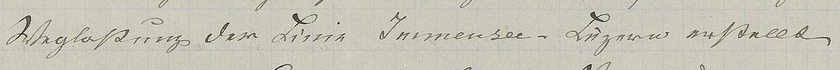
Weglaßung der Linie Immensee–Luzern erstellt
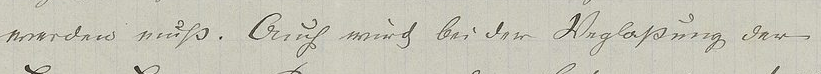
werden muß. Auch wird bei der Weglaßung der
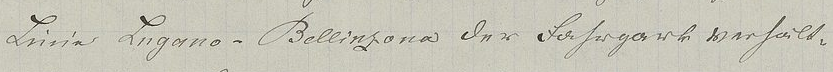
Linie Lugano–Bellinzona der Fahrpark verhält-
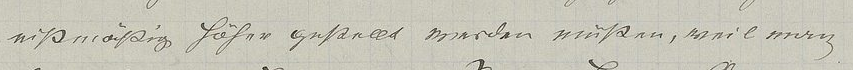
nißmäßig höher gestellt werden müßen, weil man
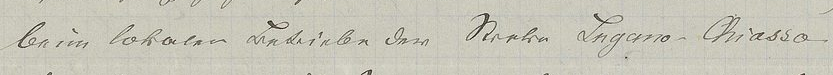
beim lokalen Betriebe der Streke Lugano–Chiasso
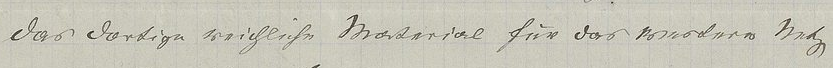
das dortige reichliche Material für das weitere Netz
